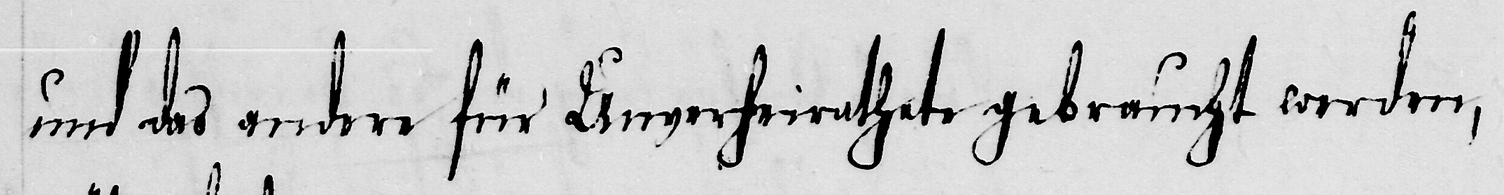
und das andere für Unverheirathete gebraucht werden,
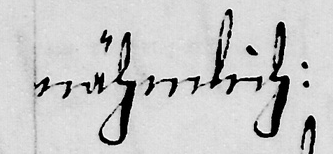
nähmlich:
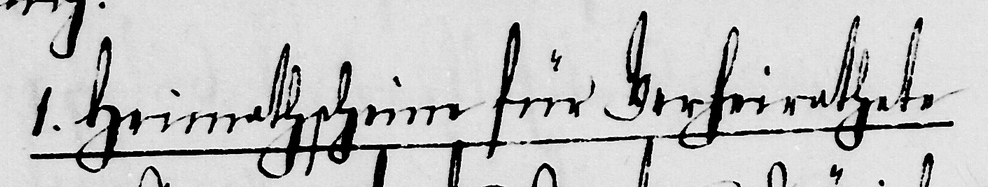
1. Heimathscheine für Verheirathete
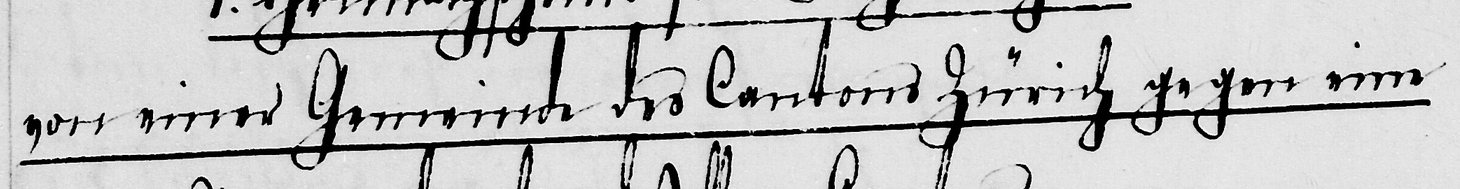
von einer Gemeinde des Cantons Zürich gegen eine
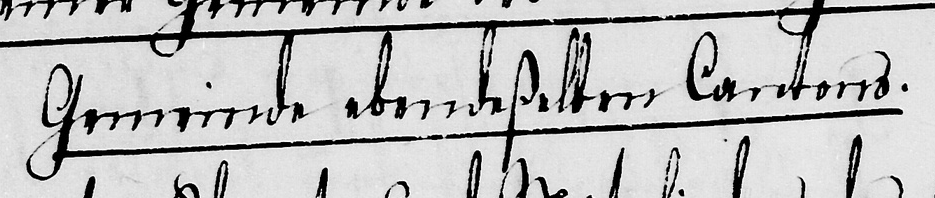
Gemeinde ebendeßelben Cantons.
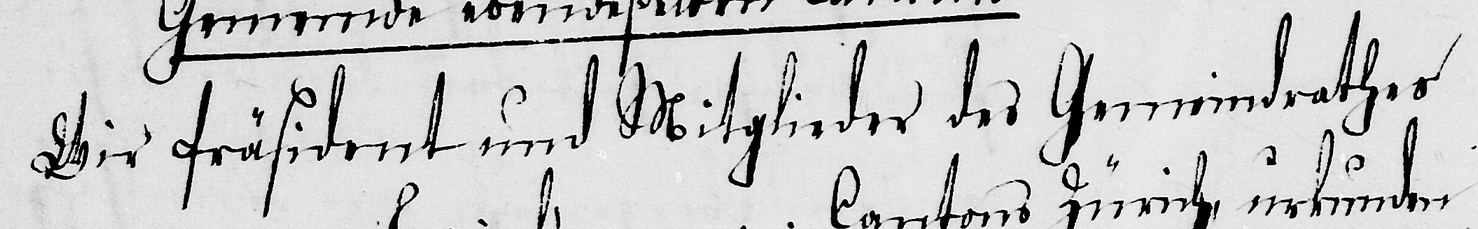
Wir Präsident und Mitglieder des Gemeindrathes
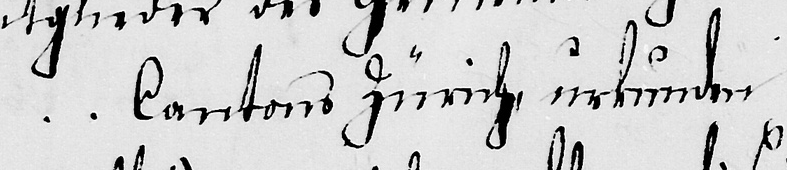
Cantons Zürich, urkunden
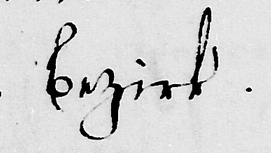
Bezirk
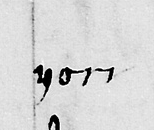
von
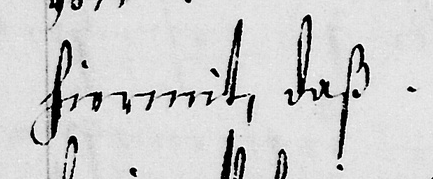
hiermit, daß
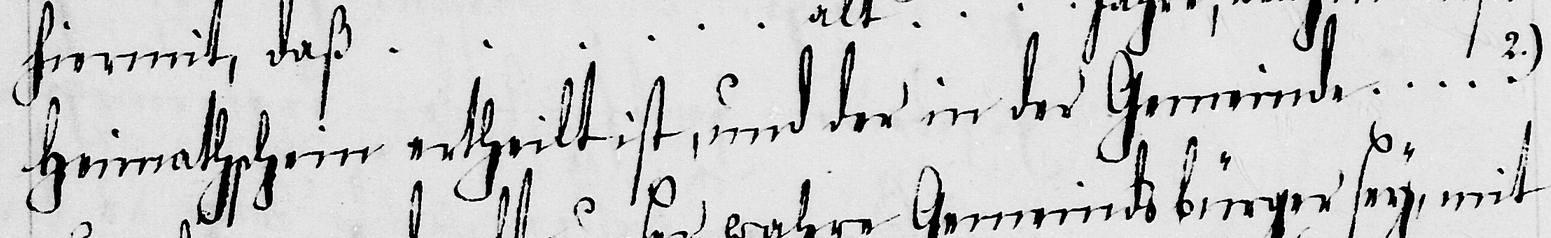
Heimathschein ertheilt ist, und der in der Gemeinde
